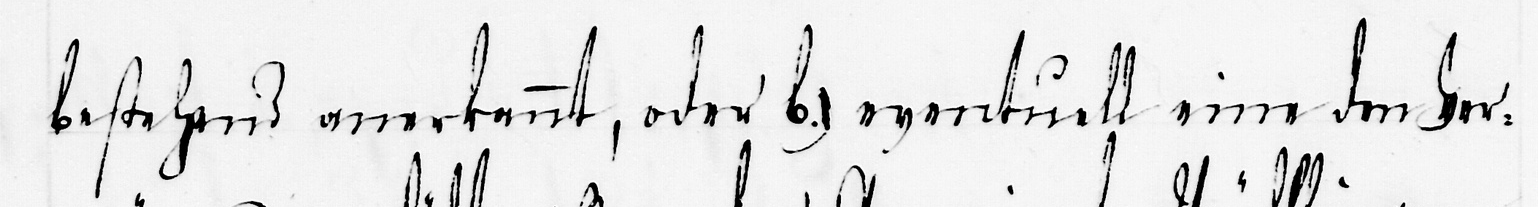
bestehend anerkannt, oder b.) eventuell eine den Ver¬
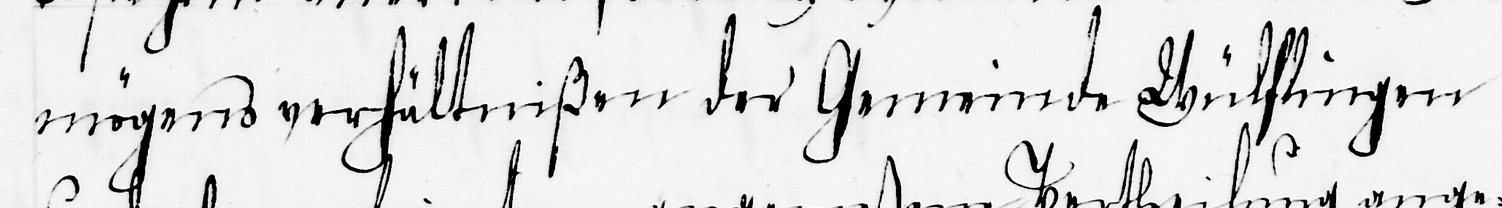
mögensverhältnißen der Gemeinde Wülflingen
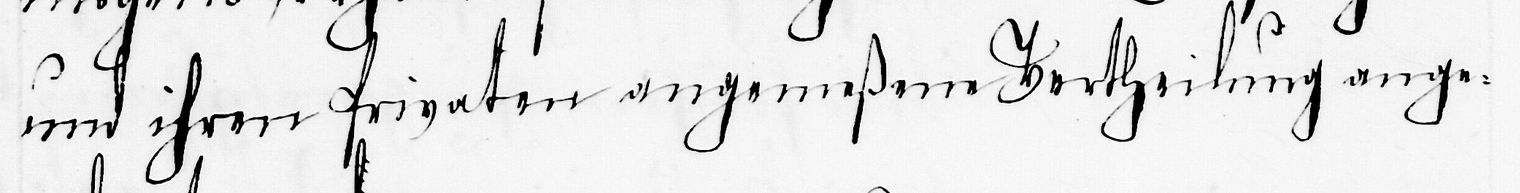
und ihren Privaten angemeßene Vertheilung ange¬
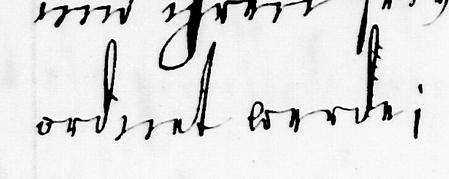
ordnet werde;
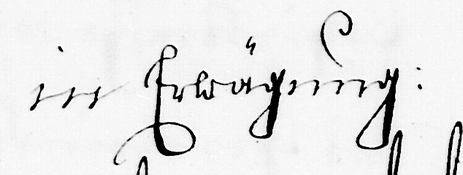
in Erwägung:
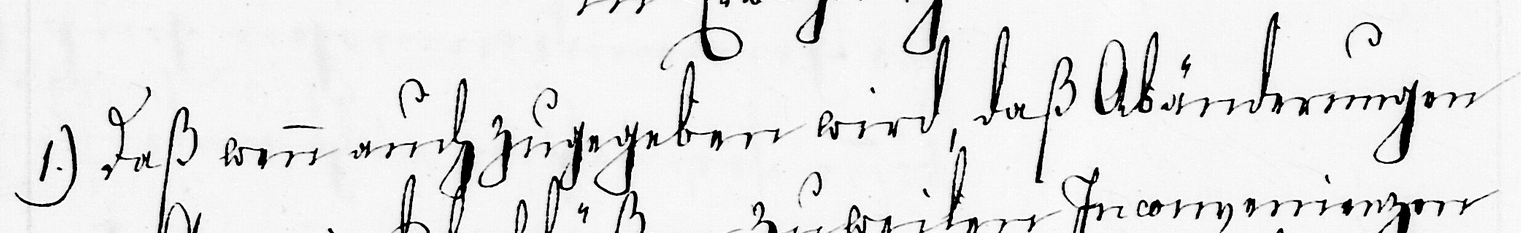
1.) Daß wenn auch zugegeben wird, daß Abänderungen
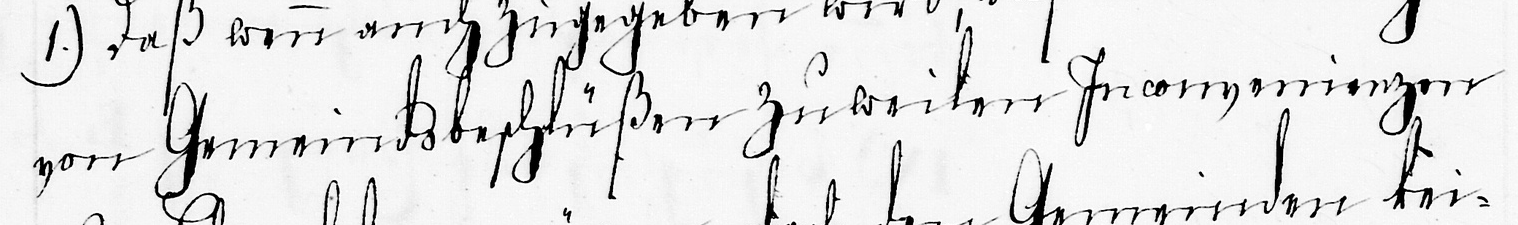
von Gemeindsbeschlüßen zuweilen Inconvenienzen
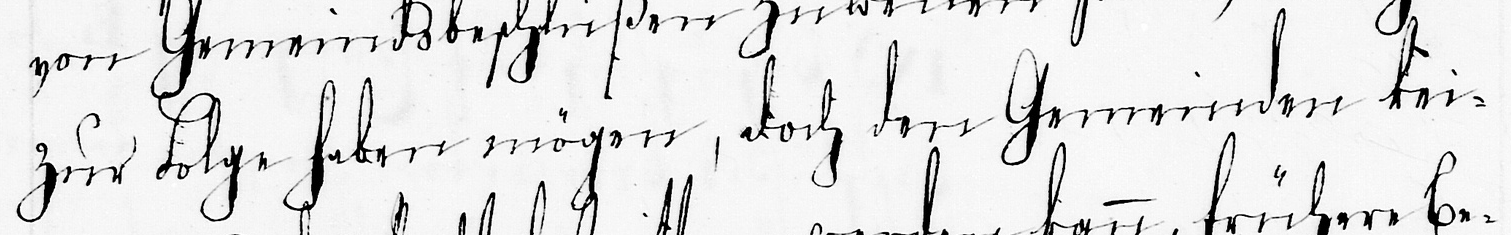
zur Folge haben mögen, doch den Gemeinden kei¬
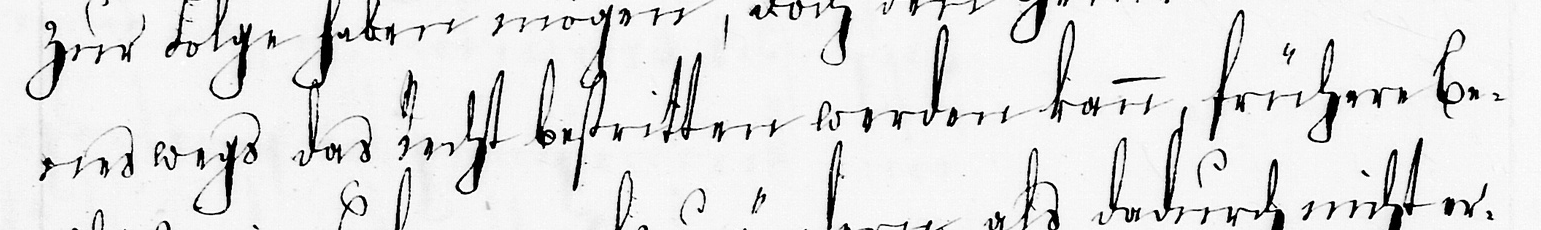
neswegs das Recht bestritten werden kann, frühere Be¬
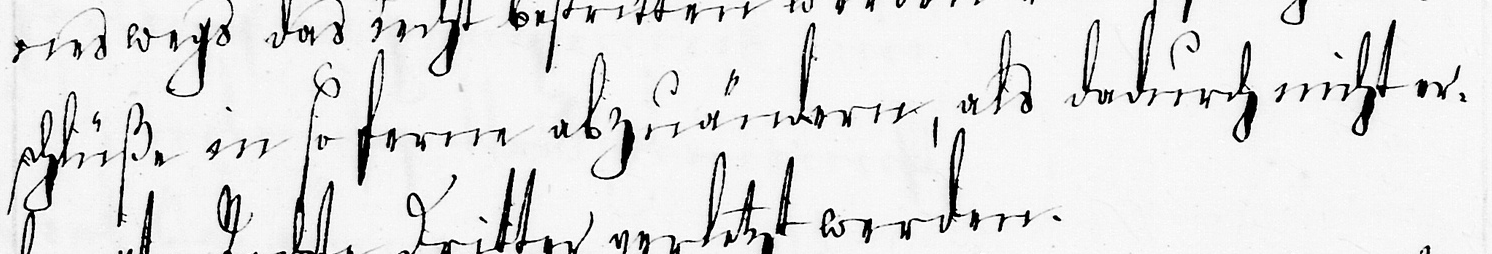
schlüße in so ferne abzuändern, als dadurch nicht er¬
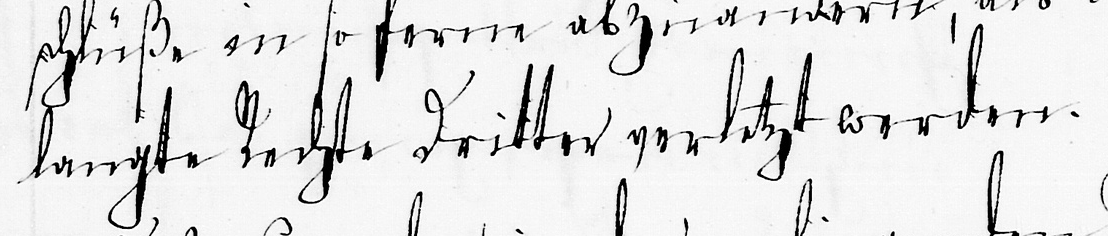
langte Rechte Dritter verletzt werden.
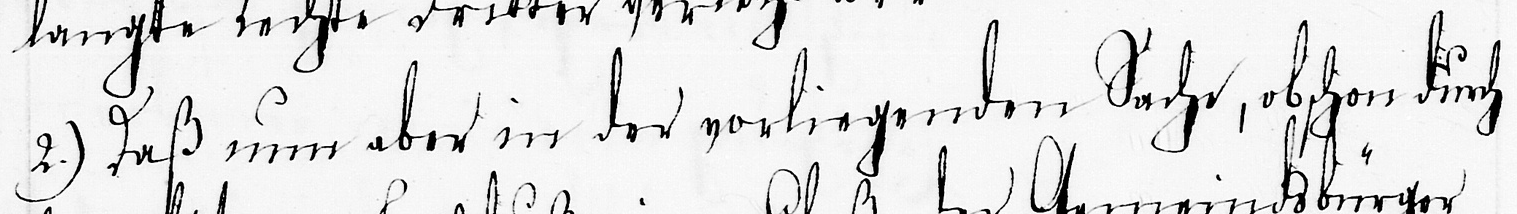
2.) Daß nun aber in der vorliegenden Sache, obschon dur¬
